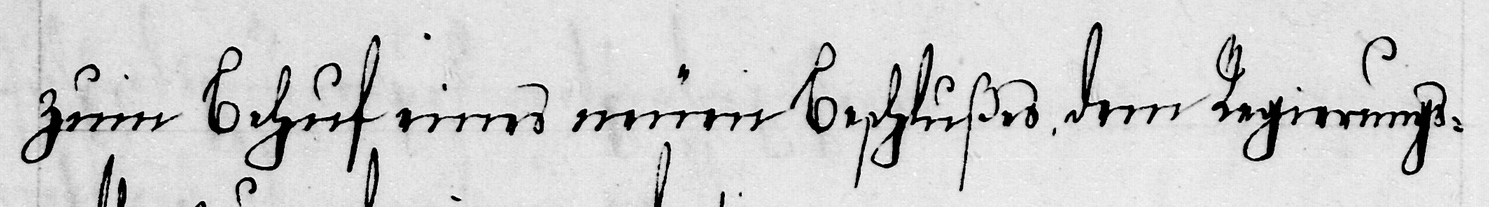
zum Behuf eines neuen Beschlußes dem Regierungs¬
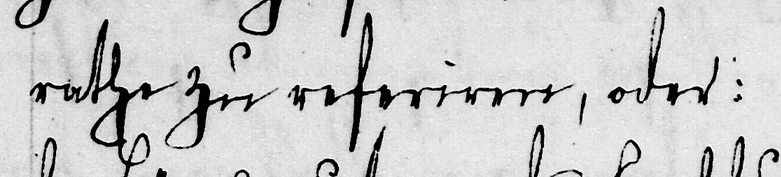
rathe zu referiren, oder:
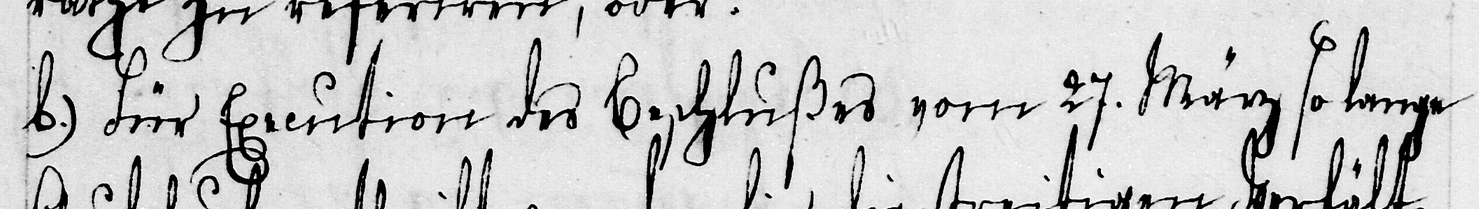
b.) Für Execution des Beschlußes vom 27. März so lange
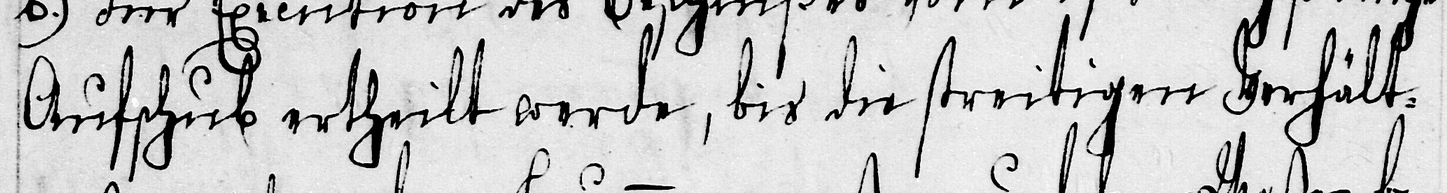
Aufschub ertheilt werde, bis die streitigen Verhält¬
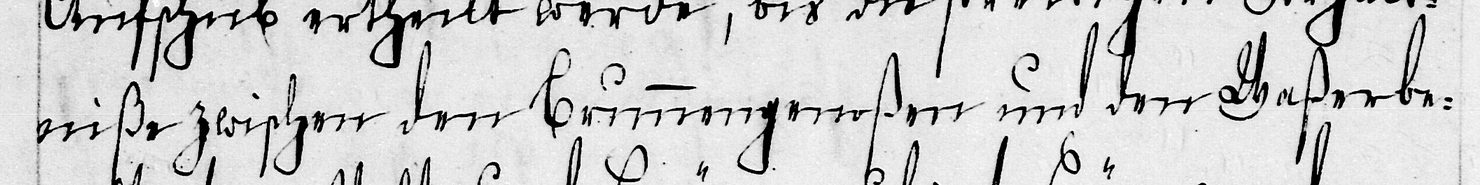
niße zwischen den Brunnengenoßen und den Waßerbe¬
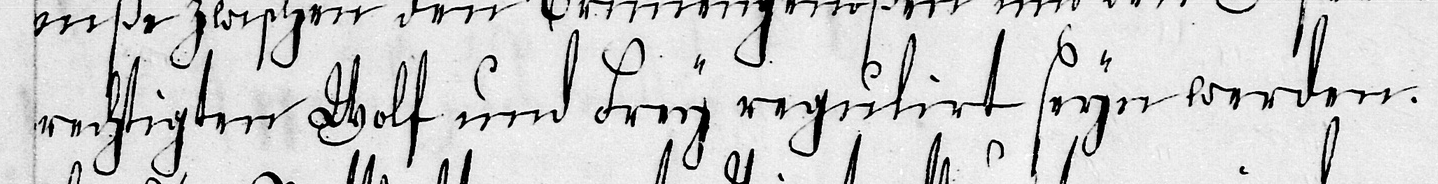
rechtigten Wolf und Frey regulirt seyn werden.
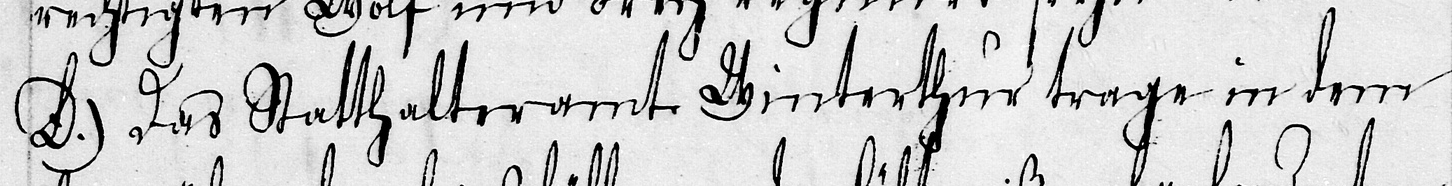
D.) Das Statthalteramt Winterthur trage in dem
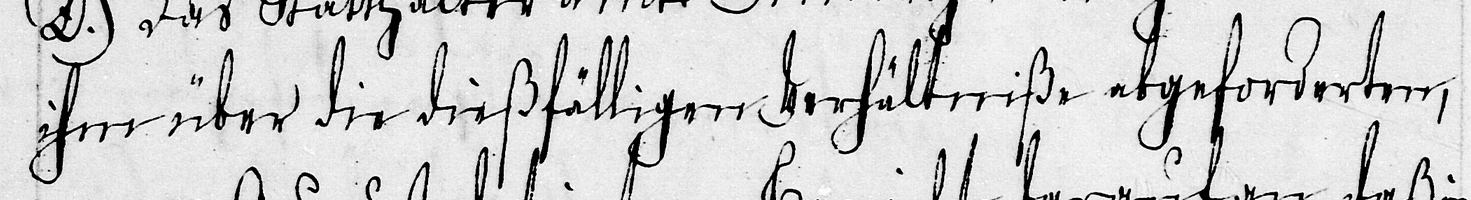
ihm über die dießfälligen Verhältniße abgeforderten,
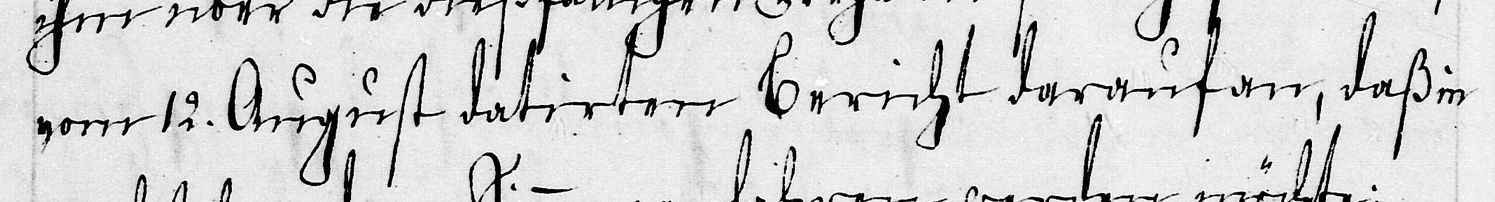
vom 12 August datirten Bericht darauf an, daß in
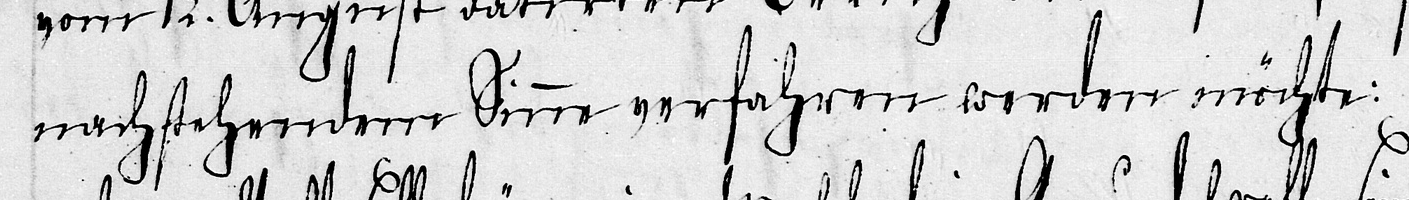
nachstehendem Sinne verfahren werden möchte.
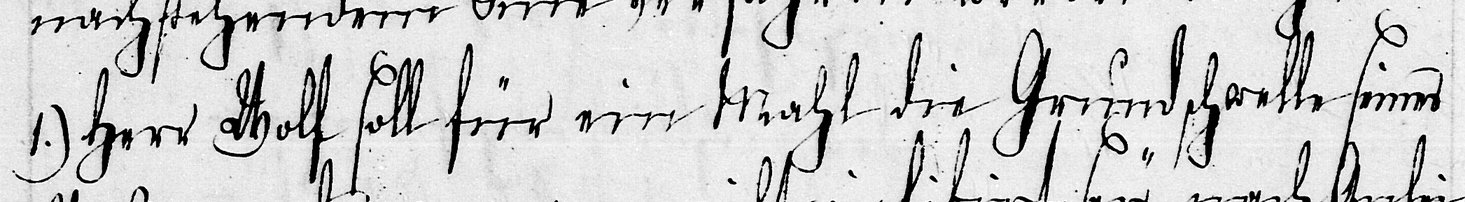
Herr Wolf soll für ein Mahl die Grundschwelle sei¬
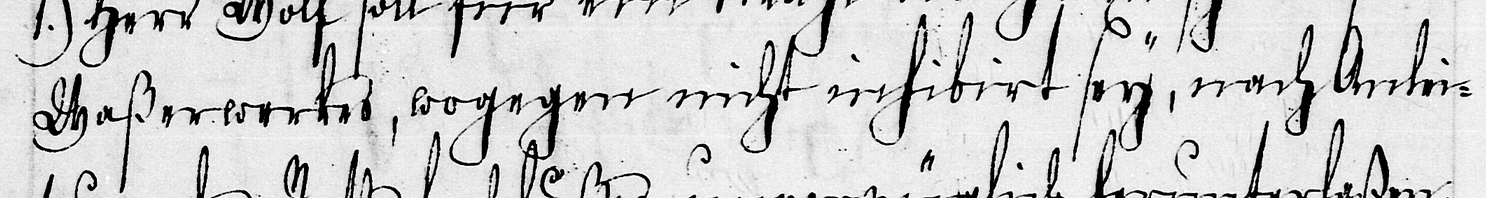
Waßerwerkes, wogegen nicht inhibirt sey, nach Anlei¬
